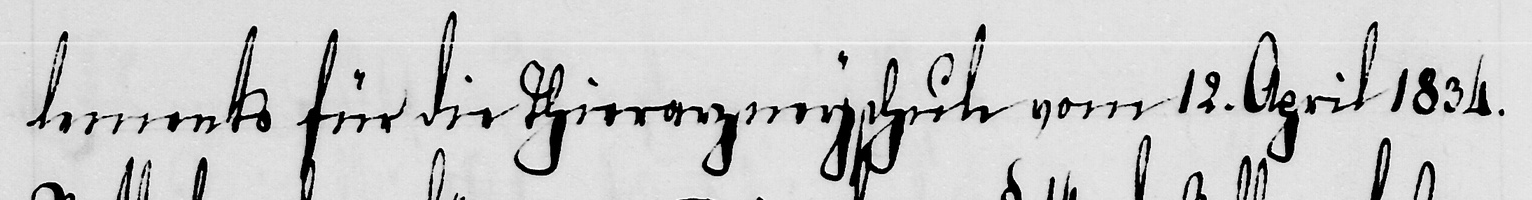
lements für die Thierarzneyschule vom 12. April 1834.
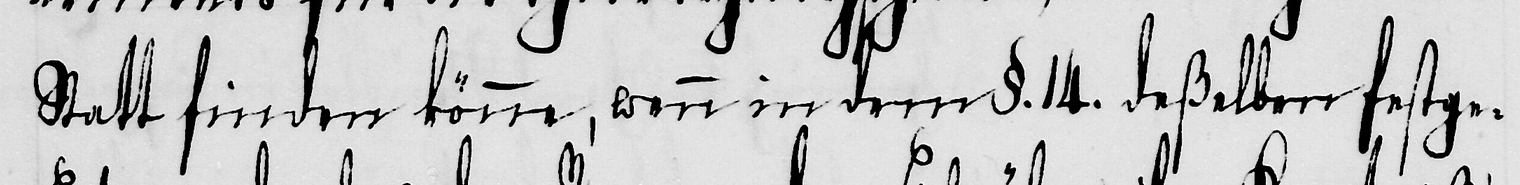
Statt finden könne, wenn in dem §. 14. deßelben festge¬
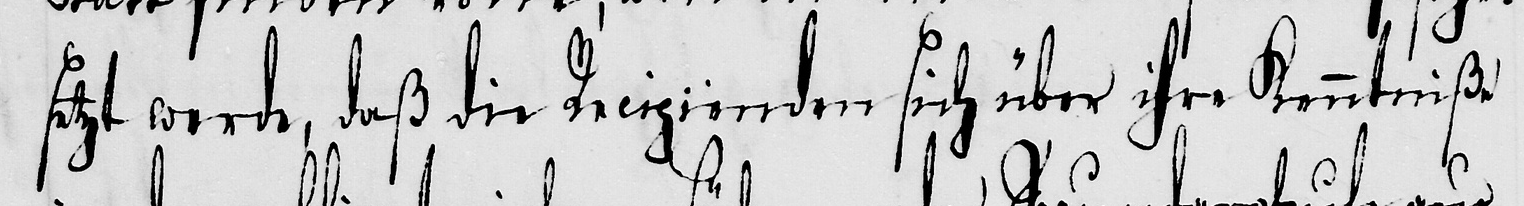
setzt werde, daß die Recipirenden sich über ihre Kenntniße
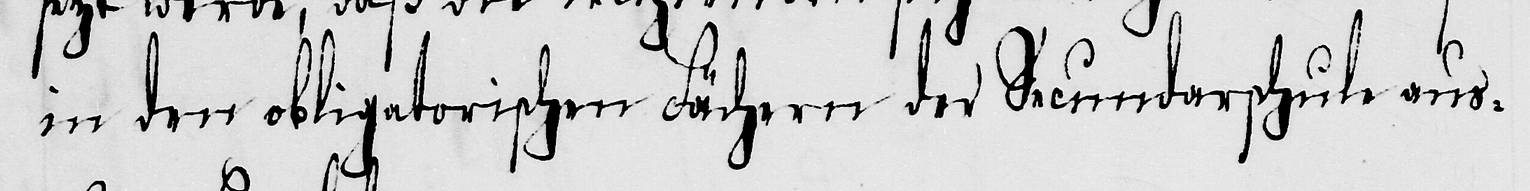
in den obligatorischen Fächern der Secundarschule aus¬
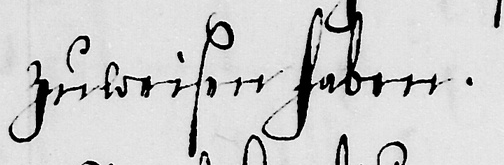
zuweisen haben.
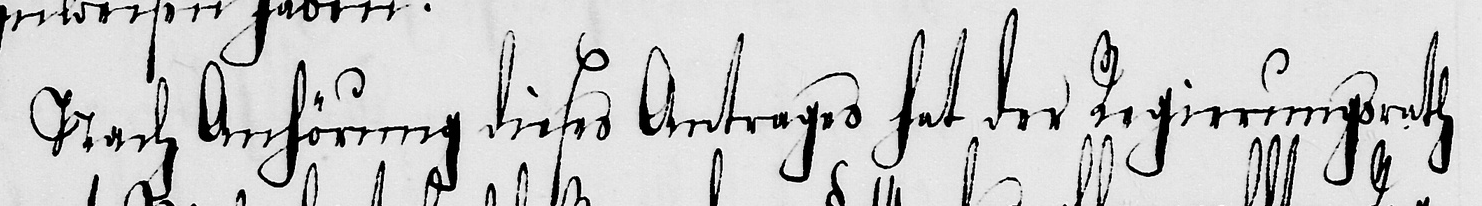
Nach Anhörung dieses Antrages hat der Regierungsrath
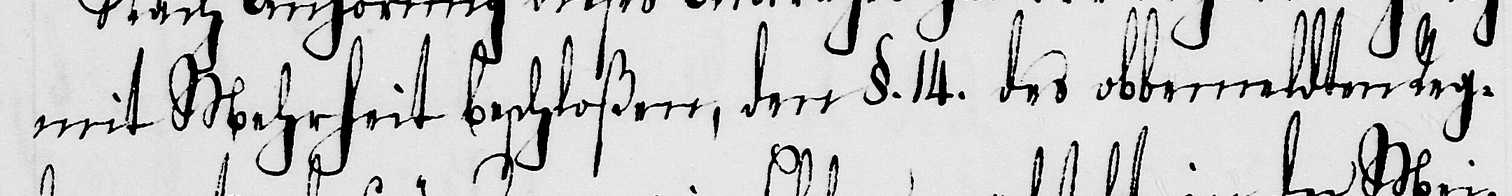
mit Mehrheit beschloßen, den §. 14. des obbemeldten Reg¬
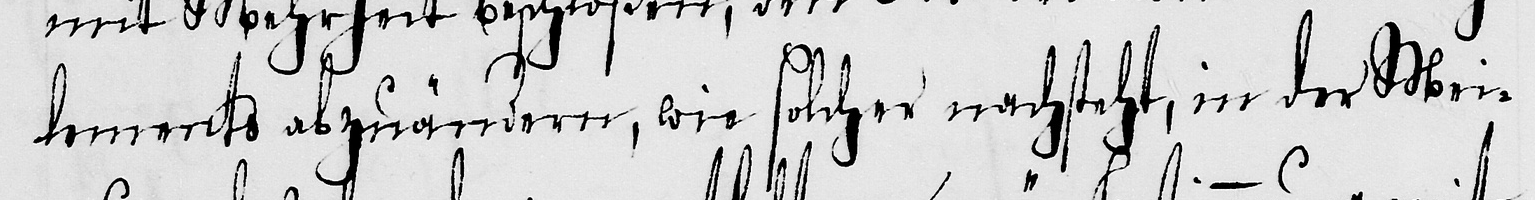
lements abzuändern, wie solcher nachsteht, in der Mei¬
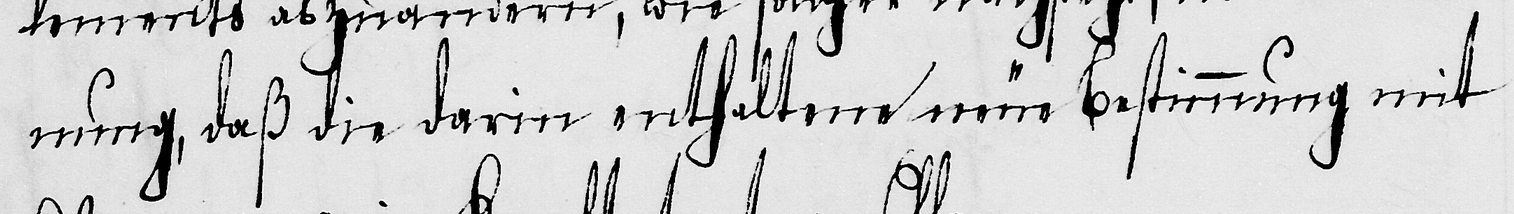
nung, daß die darin enthaltene neue Bestimmung mit
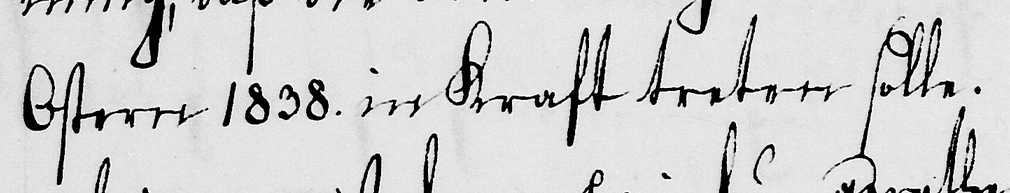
Ostern 1838. in Kraft treten solle.
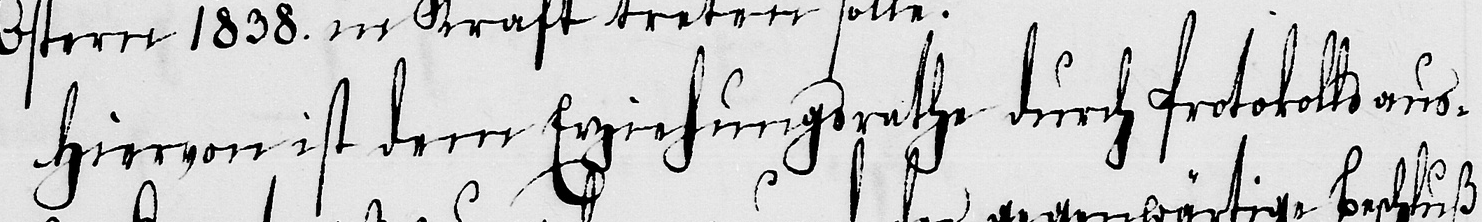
Hiervon ist dem Erziehungsrathe durch Protokollsau¬
